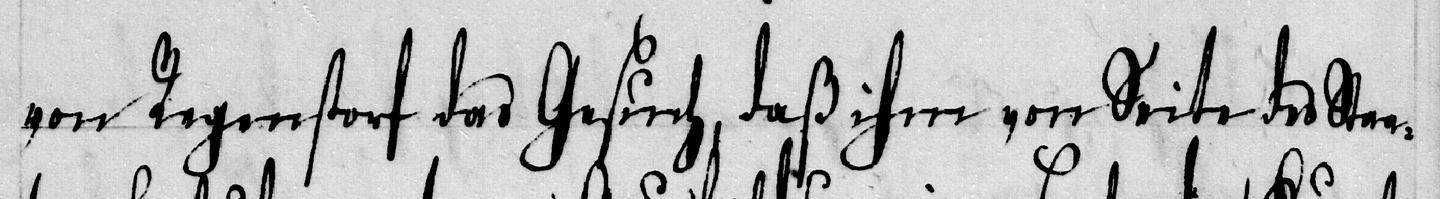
von Regenstorf das Gesuch, daß ihm von Seite des Sta¬
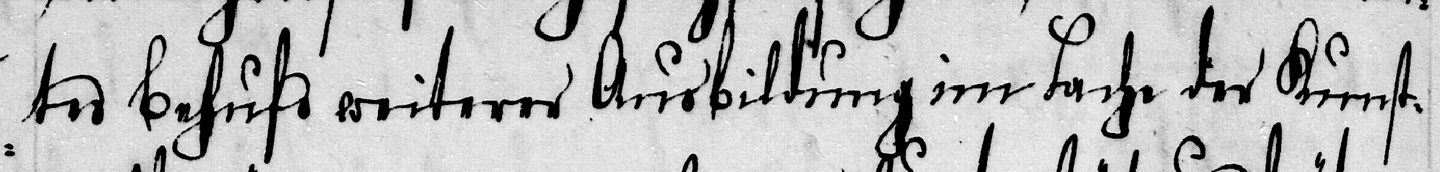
ates Behufs weiterer Ausbildung im Fache der Kunst¬
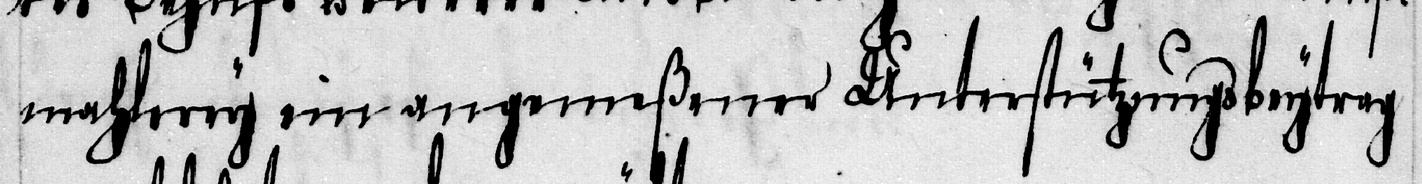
mahlerey ein angemeßener Unterstützungsbeytrag
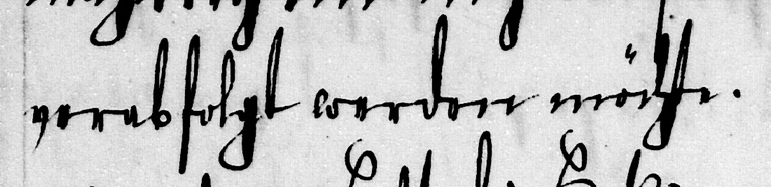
verabfolgt werden möchte.
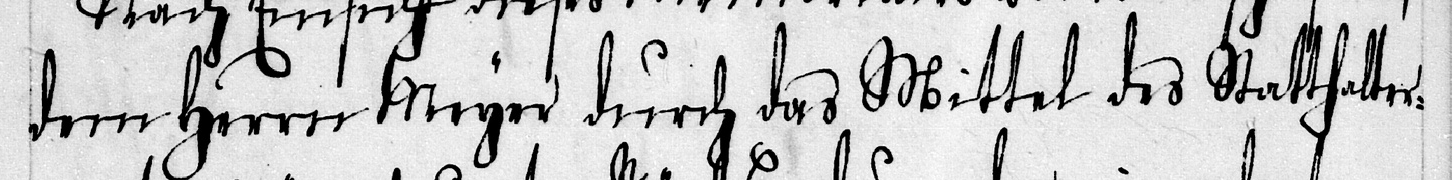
dem Herrn Meyer durch das Mittel des Statthalte¬
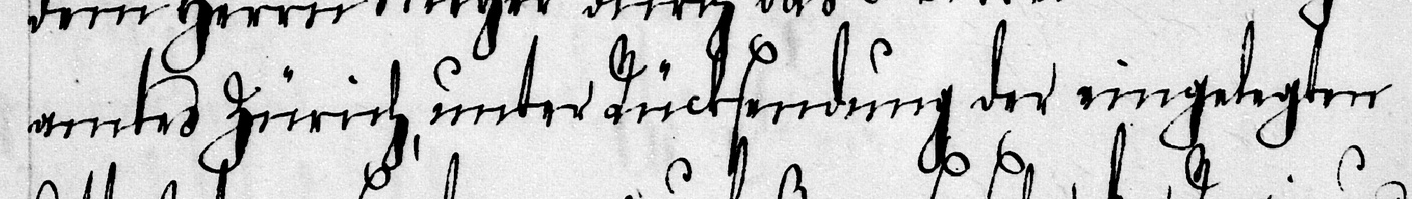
ramtes Zürich, unter Rücksendung der eingelegten
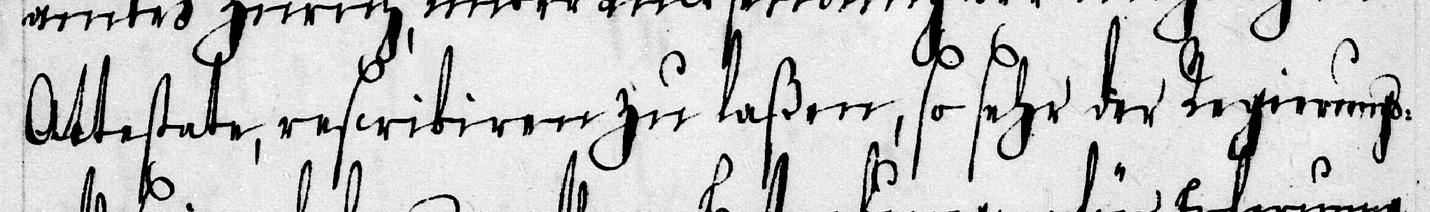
Attestate, rescribiren zu laßen, so sehr der Regierungs¬
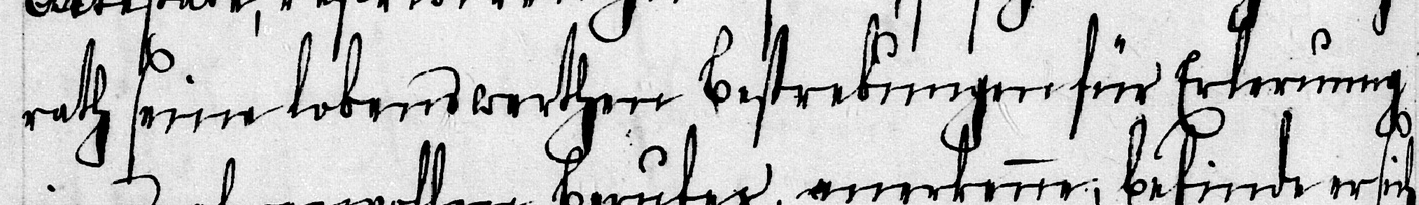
rath seine lobenswerthen Bestrebungen für Erlernung
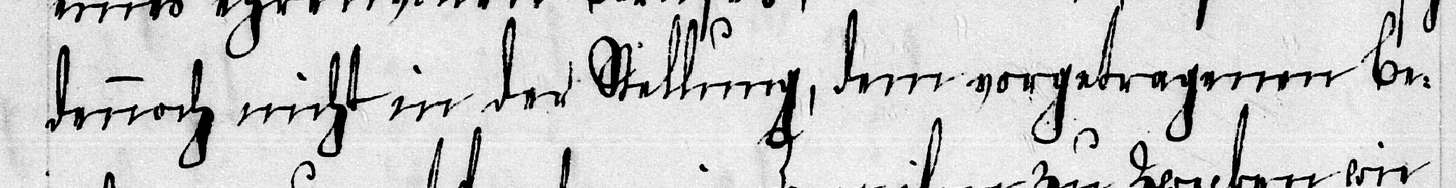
dennoch nicht in der Stellung, dem vorgetragenen Be¬
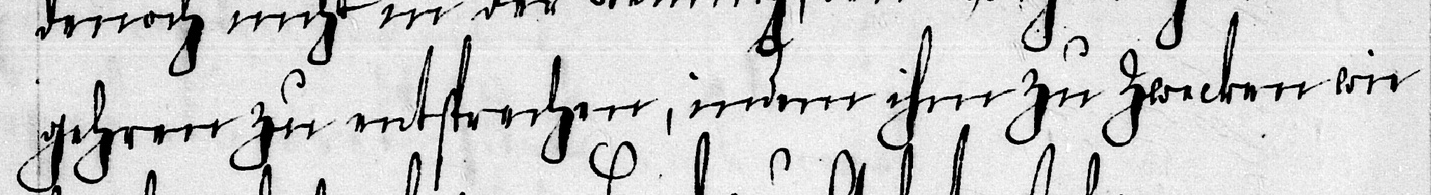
gehren zu entsprechen, indem ihm zu Zwecken wie
